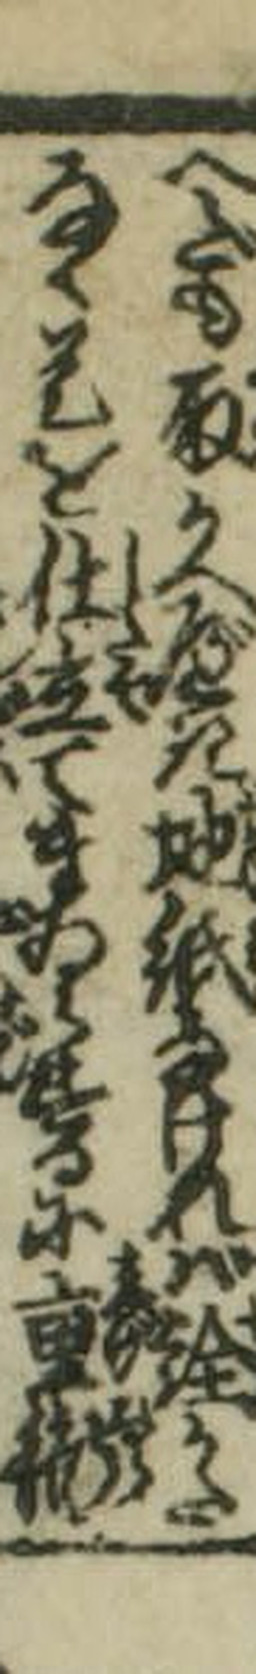なく是を仕立てまゐらするに重衡
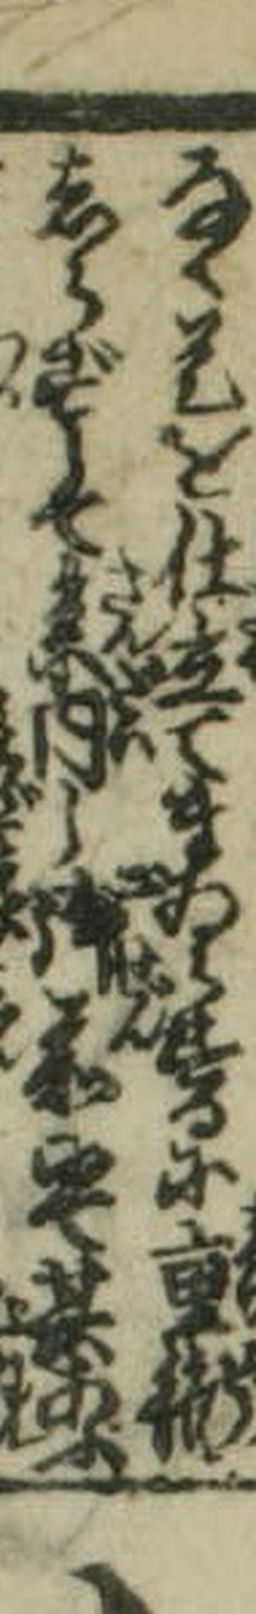しらずして参内し御前にて其あふ
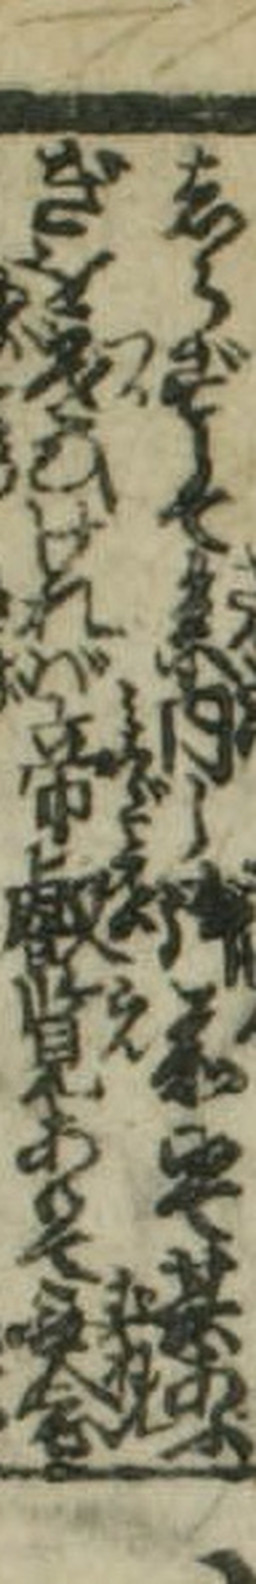ぎを遣ひければ帝叡覧ありて無念
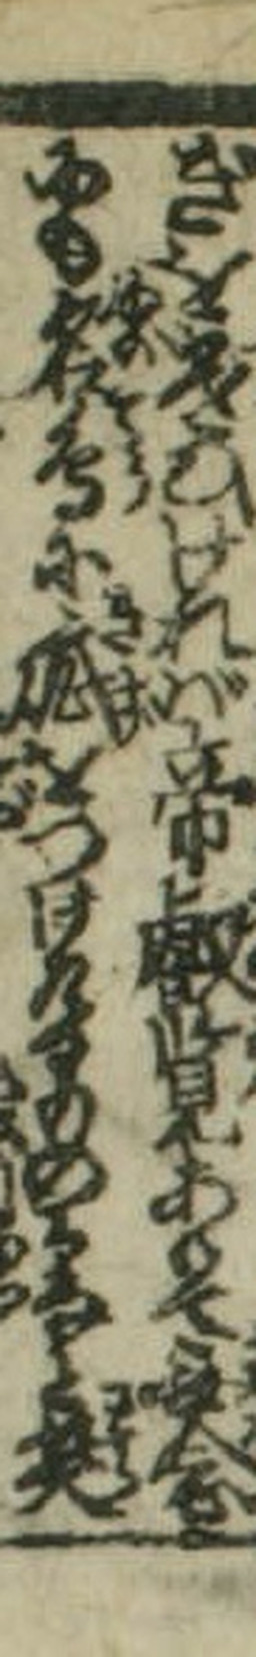にも名鳥に疵をつけけるものかなと笑
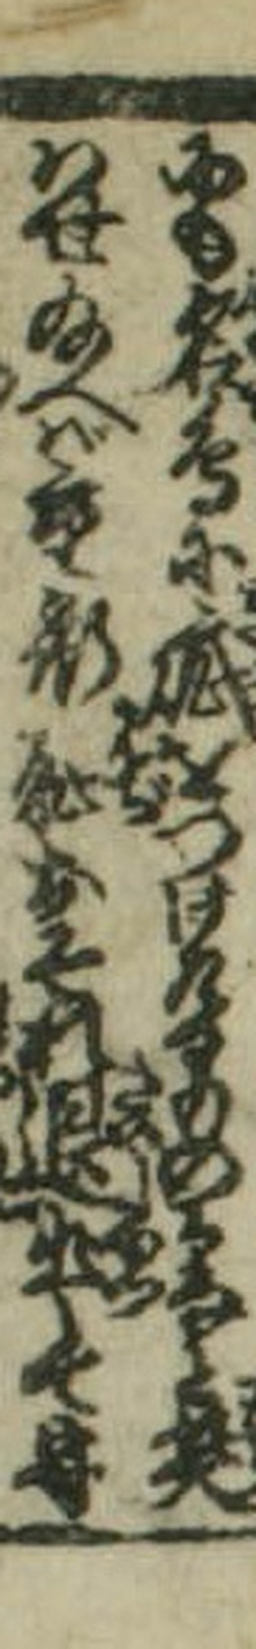はせ給へば重衡恥おそれ退出して守
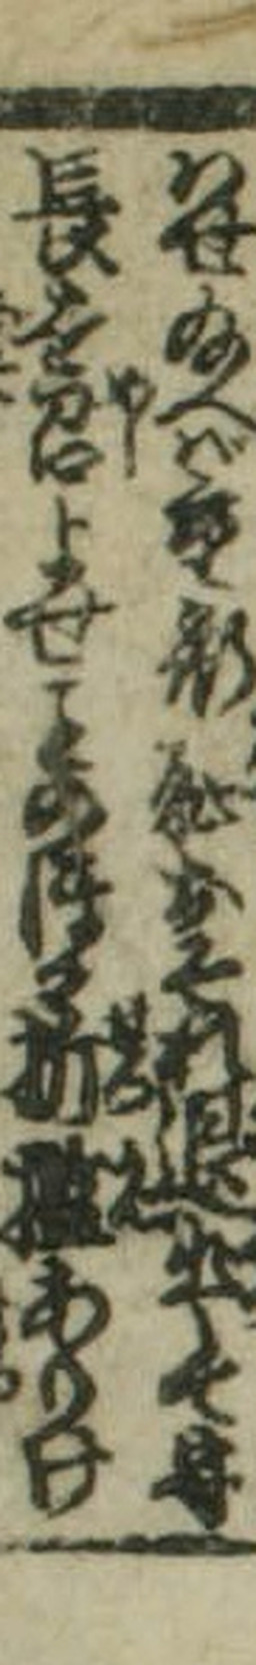長を召よせことのほか折檻ありけ
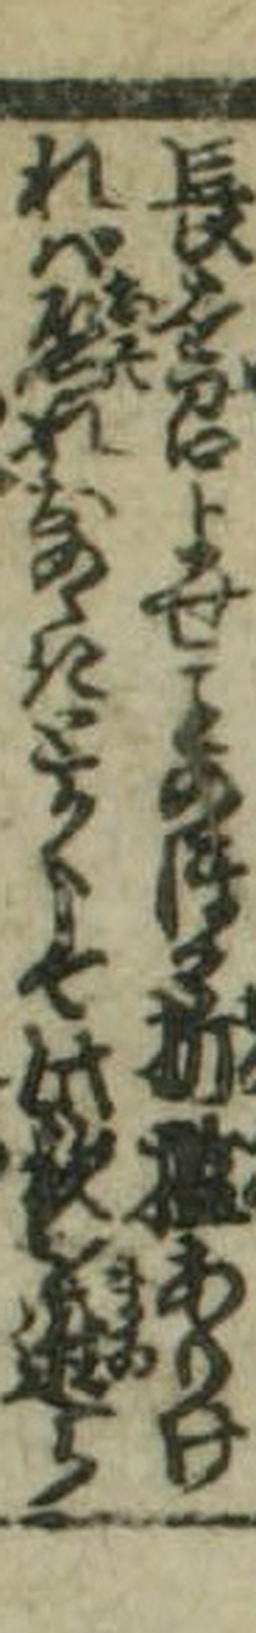れば恐れおのゝきとかくして此歌を進ら
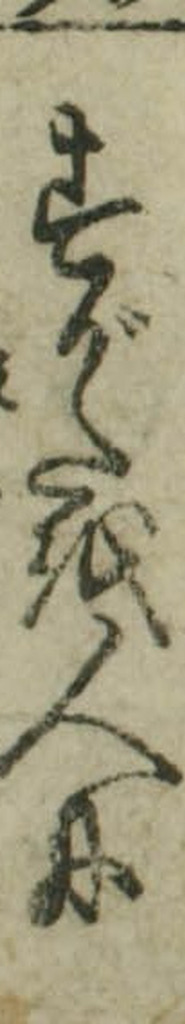すがたを人に
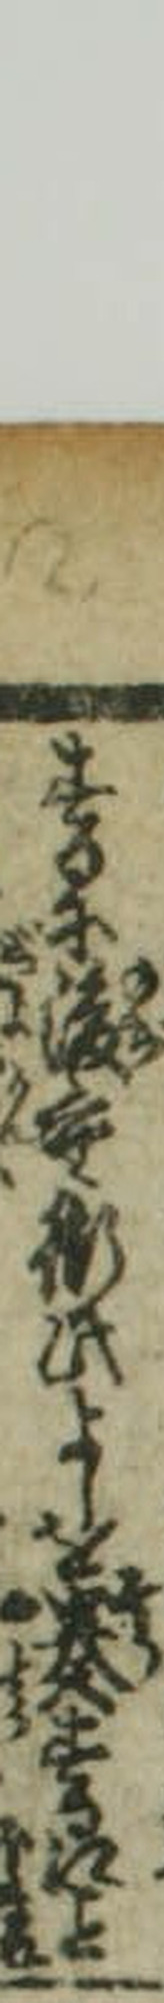するに後重衡此よしを奏するにこと
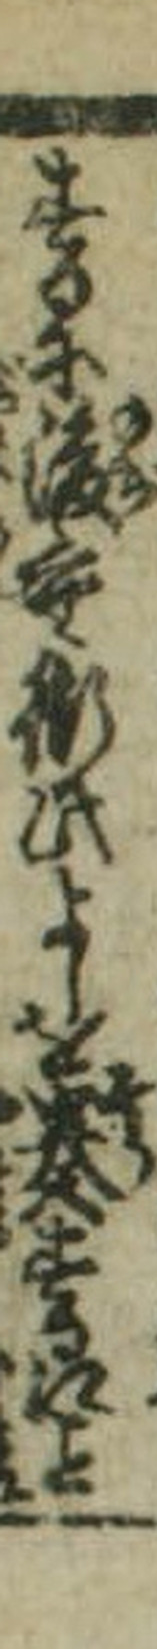するに後重衡此よしを奏するにこと
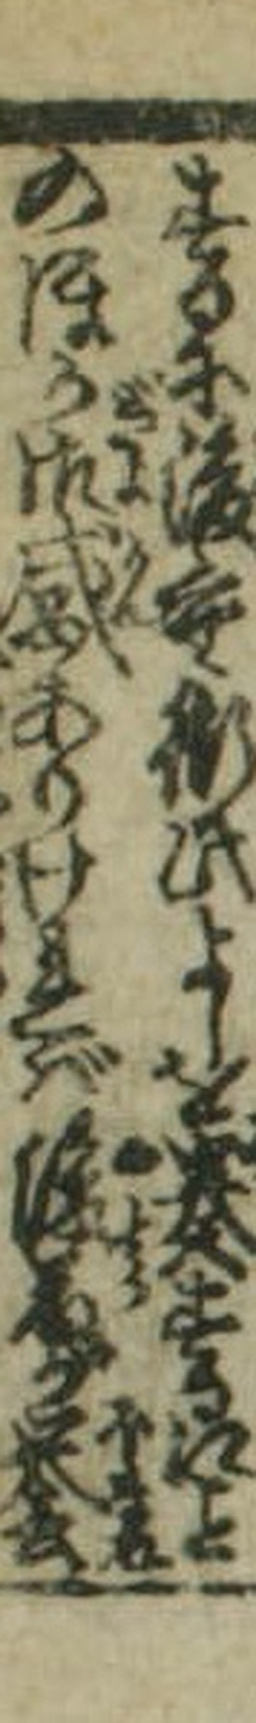のほか御感ありければ後藤が誉
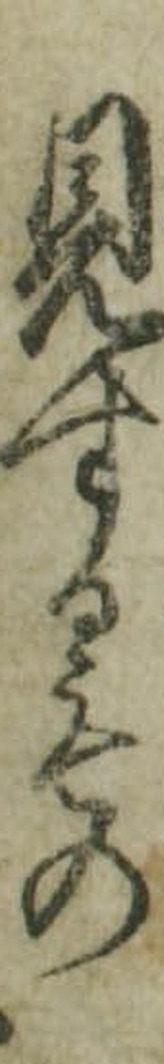見するもの
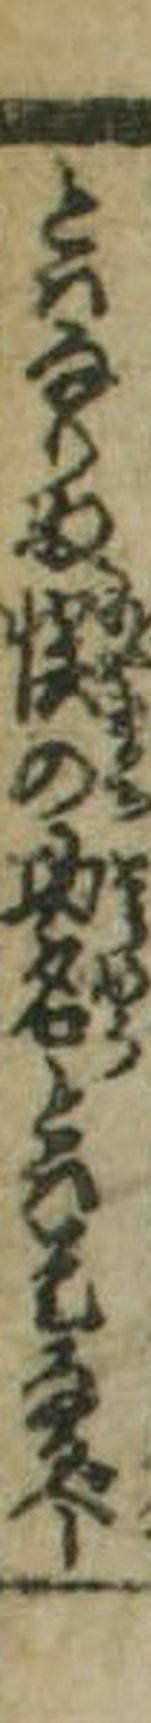とはなりぬ誤の功名とは是なるべし

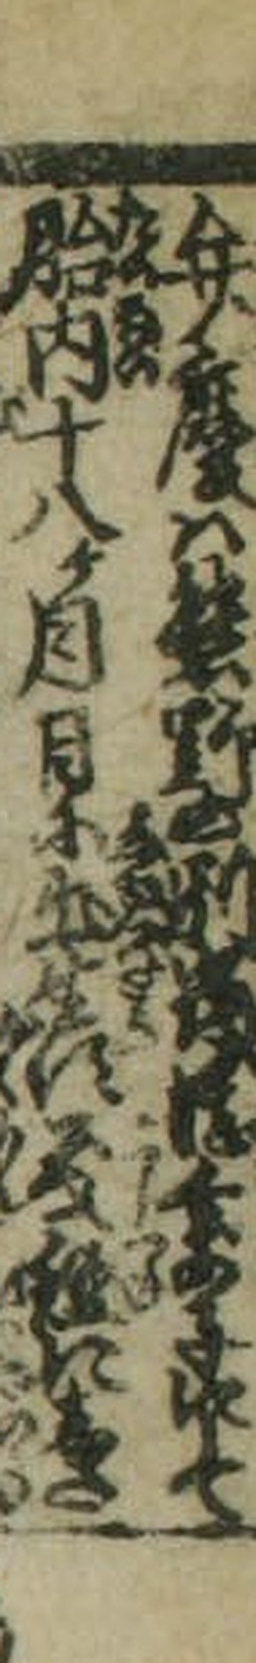胎内十八ヶ月目に出生す義経にした
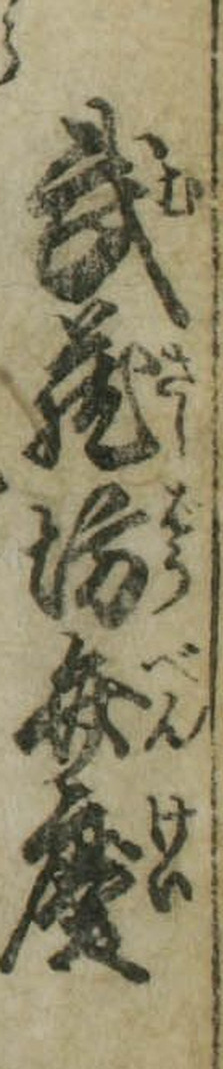武蔵坊弁慶
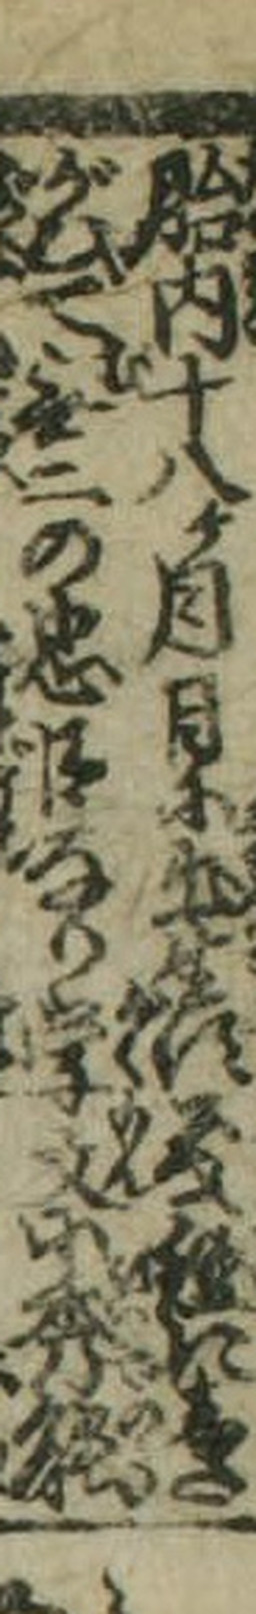がひて無二の忠臣なり学文に秀能
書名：續英雄百人一首
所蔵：東京学芸大学附属図書館
